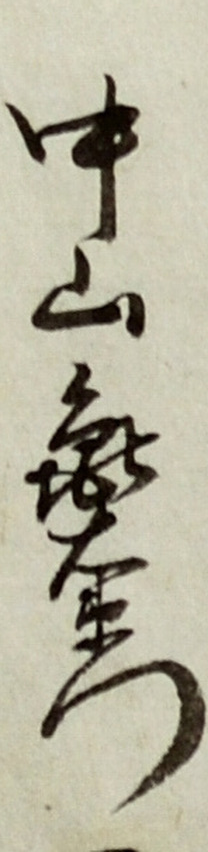中山亀右衛門㊞

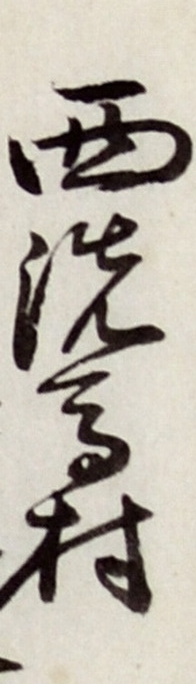西洗馬村
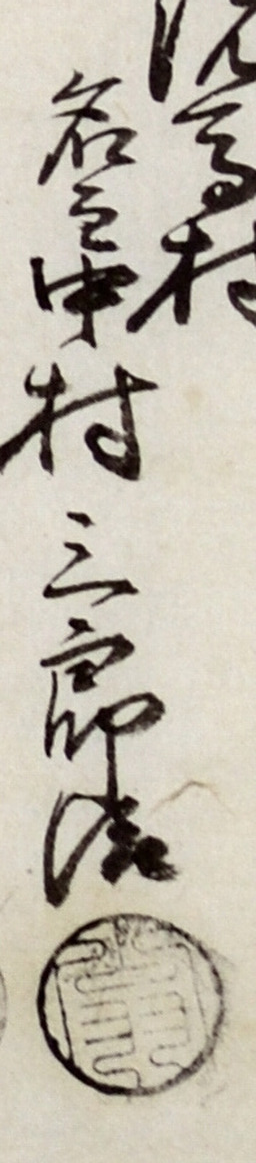名主中村三郎治㊞
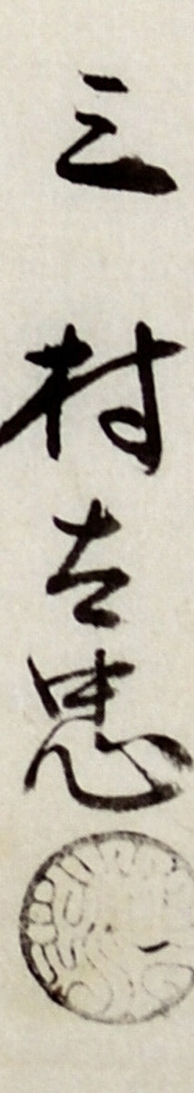三村太忠㊞
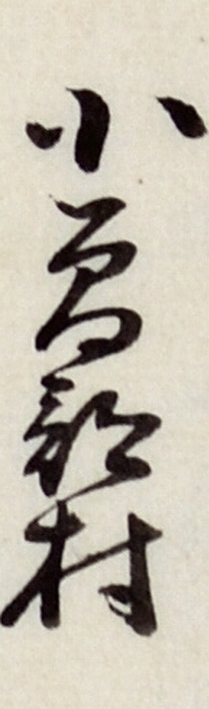小曽部村
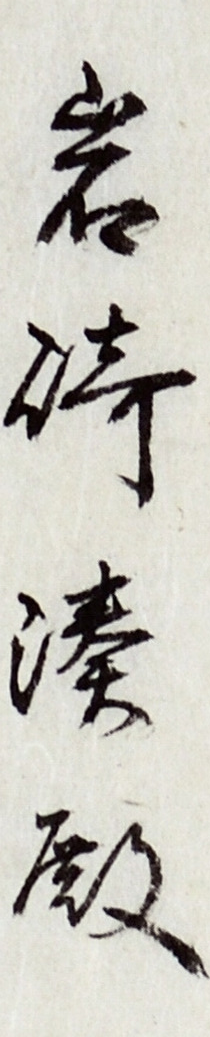岩崎湊殿
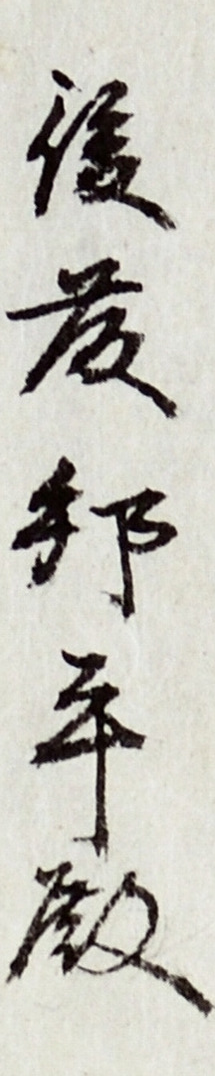後藤邦平殿
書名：御林御下ケ渡御請印帳
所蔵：伊那市立高遠町図書館・合同会社AMANE
